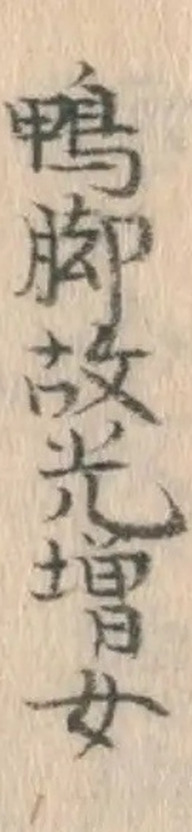鴨脚故光増女鴨
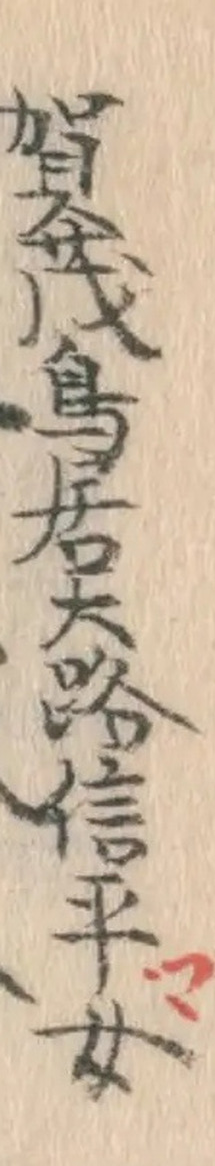賀茂鳥居大路信平卿女
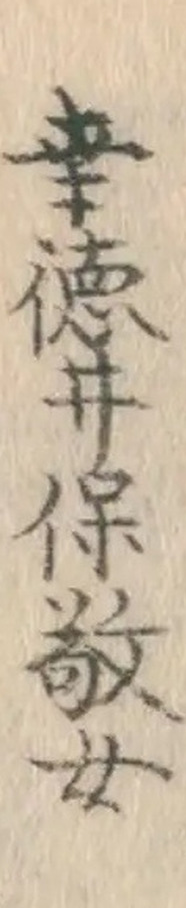幸徳井保敬女

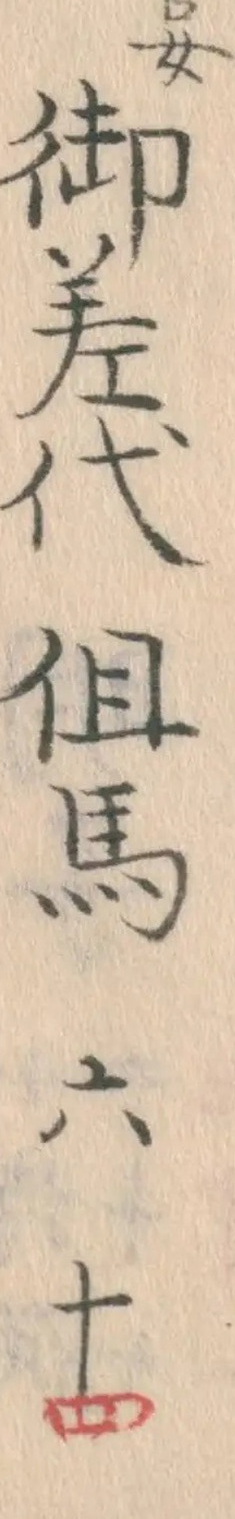御差代但馬六十四
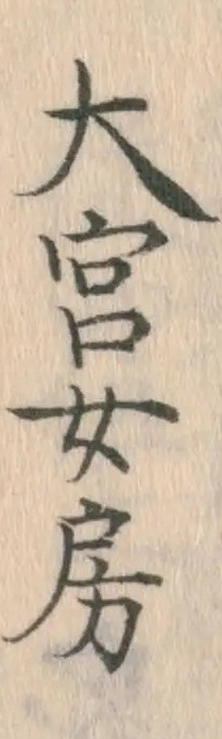大宮女房
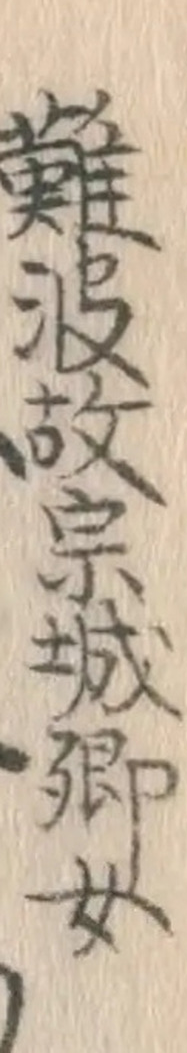難波故宗城卿女
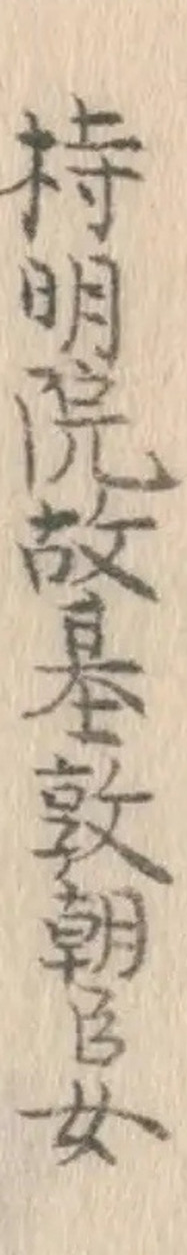持明院故基敦朝臣女藤
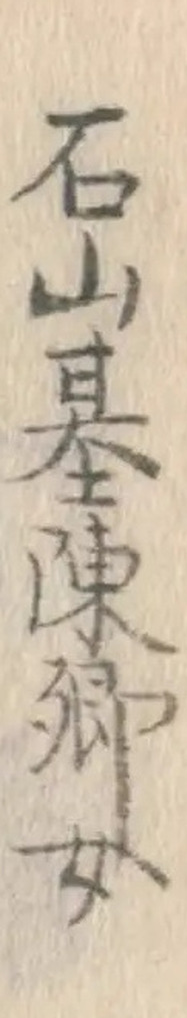石山基陳卿女藤
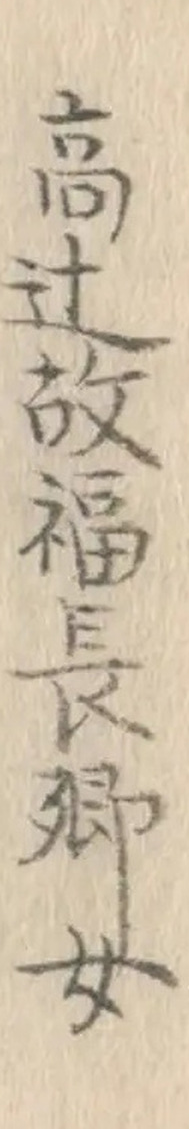高辻故福長卿女菅

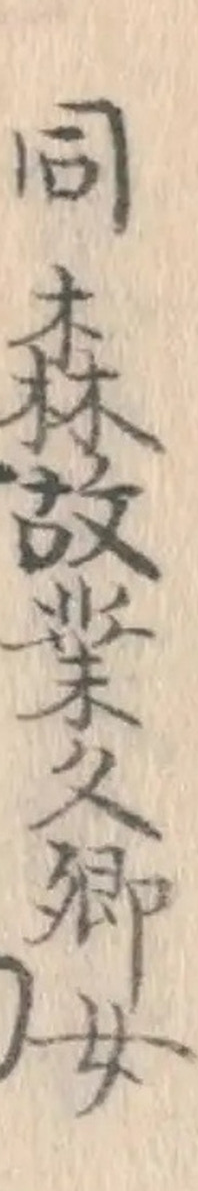同森故業久卿女
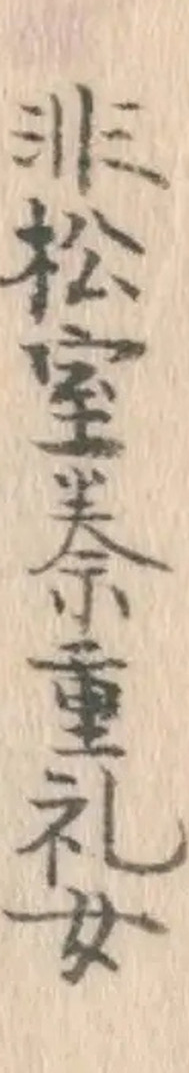非松室泰重礼女泰
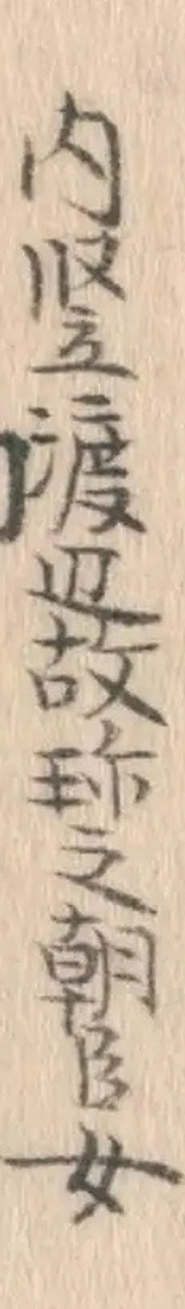内竪渡部故珍之朝臣女
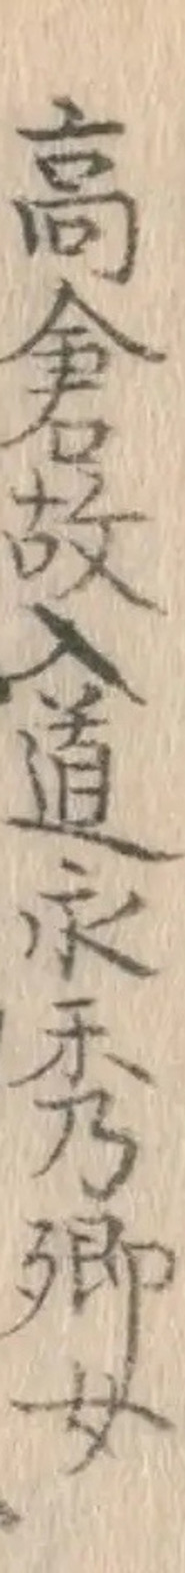高倉院故入道永秀卿女
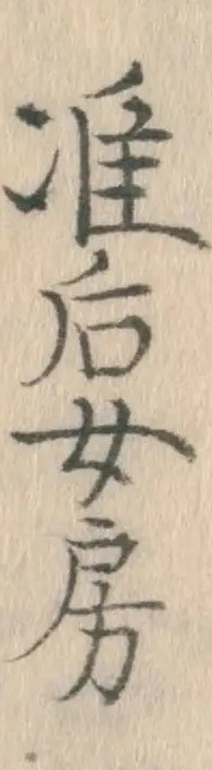准后女房
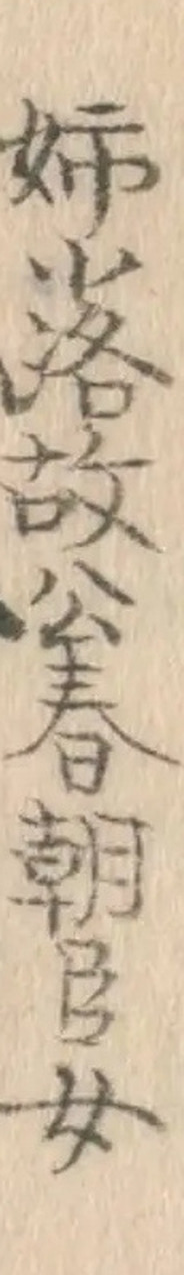姉小路故公春朝臣女藤
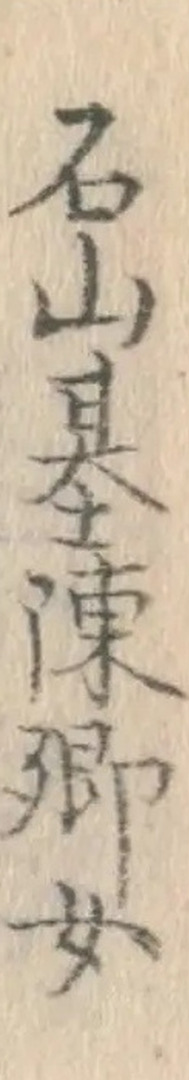石山基陳卿女
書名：賀茂社記録. 第80冊
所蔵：国立国会図書館 National Diet Library, JAPAN
